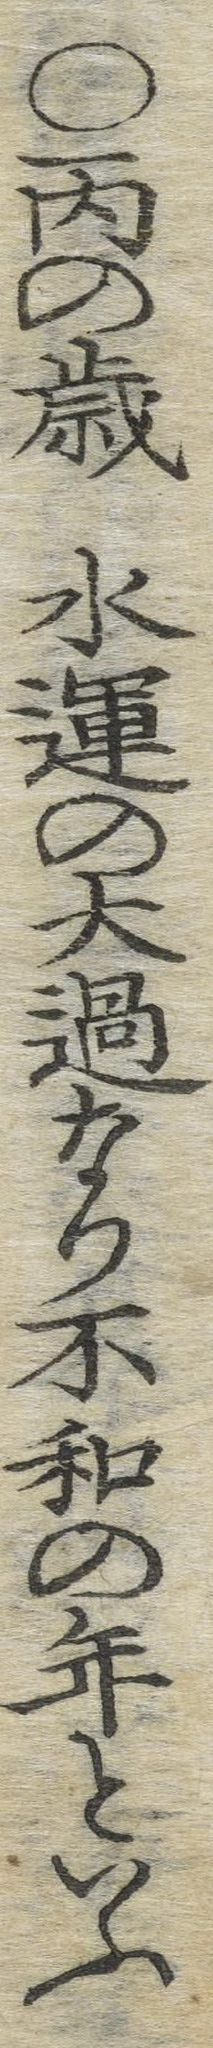〇丙の歳水運の大過なり不和の年といふ
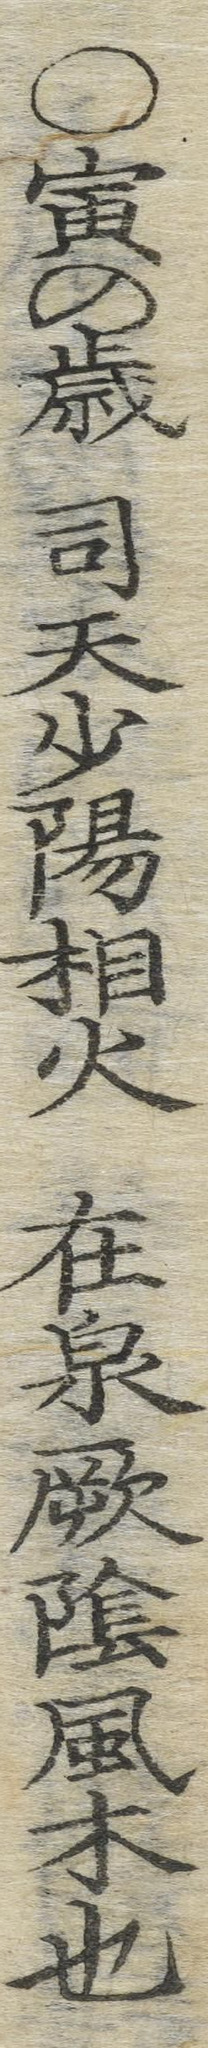〇寅の歳司天少陽相火在泉厥陰風木也
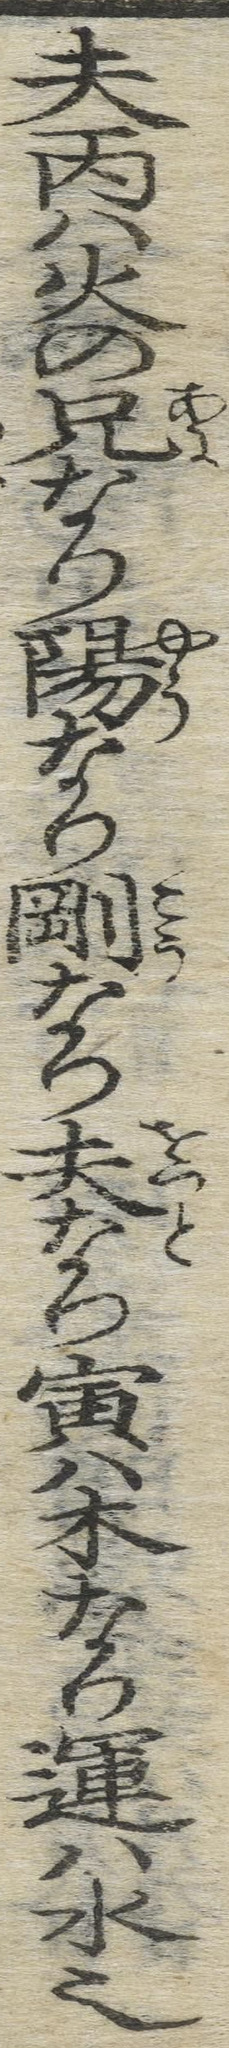夫丙は火の兄なり陽なり剛なり夫なり寅は木なり運は水也
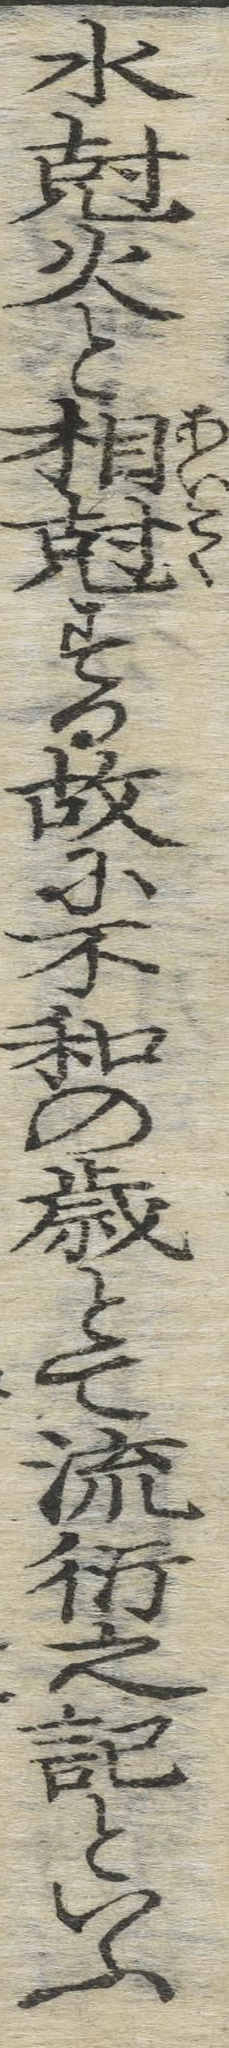水剋火と相剋する故に不和の年とて流行之記といふ
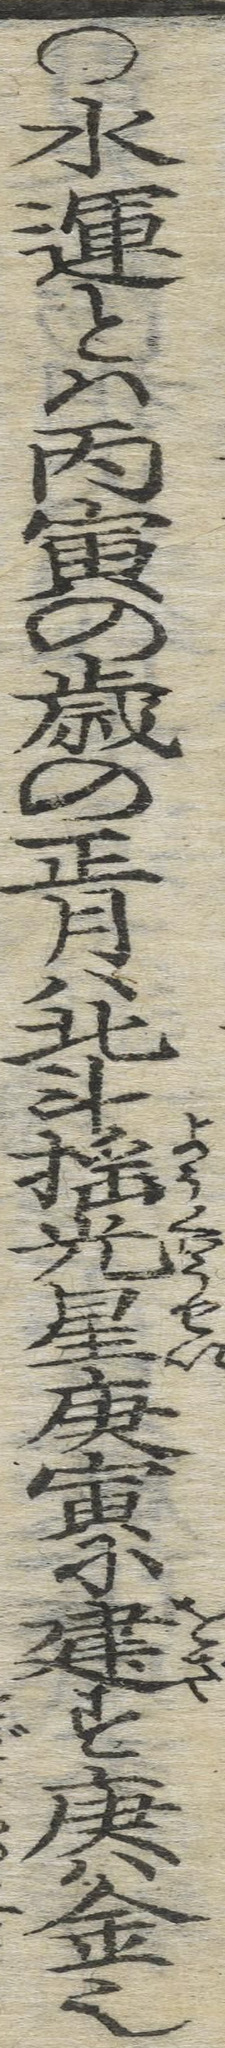〇水運とは丙寅の歳の正月は北斗揺光星庚寅に建す庚は金也
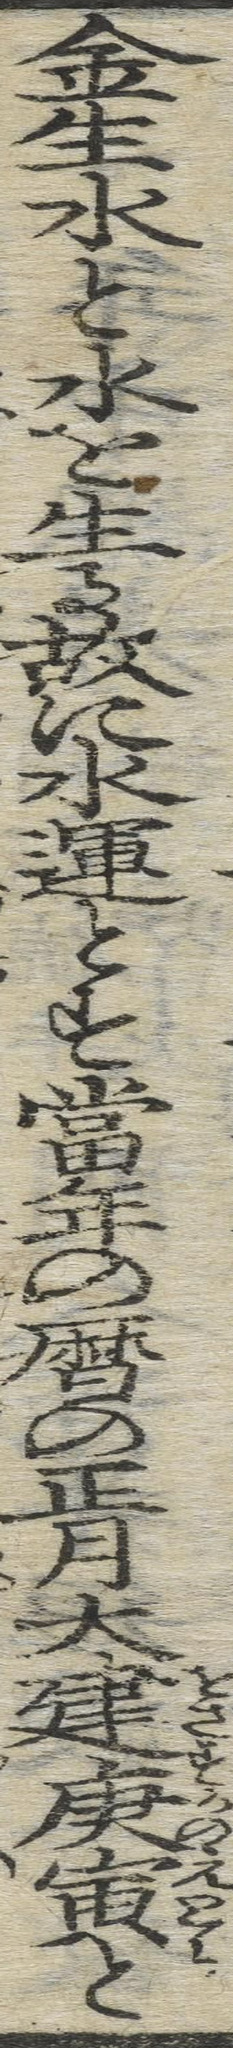金生水と水を生る故に水運とす當年の暦の正月大建庚寅と
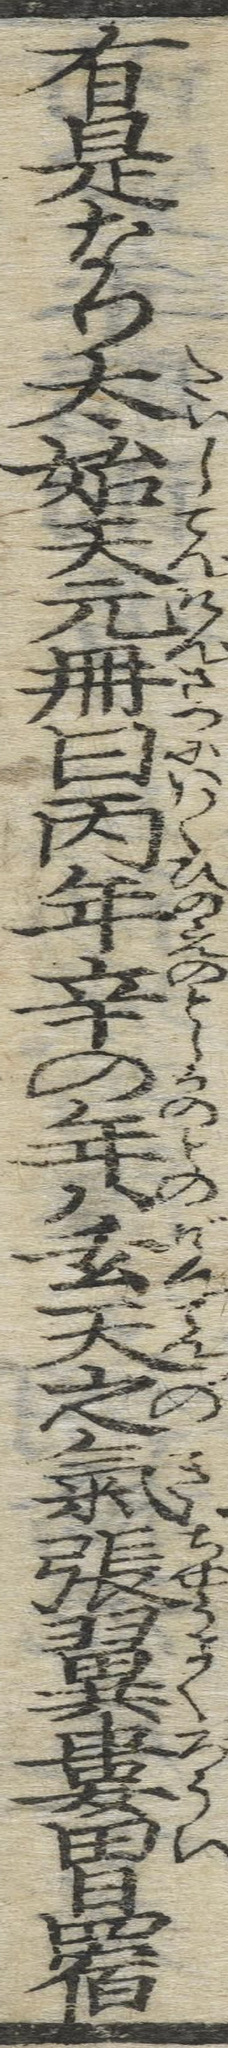有是なり太始天元冊曰丙年辛の年は玄天之気張翼婁胃宿
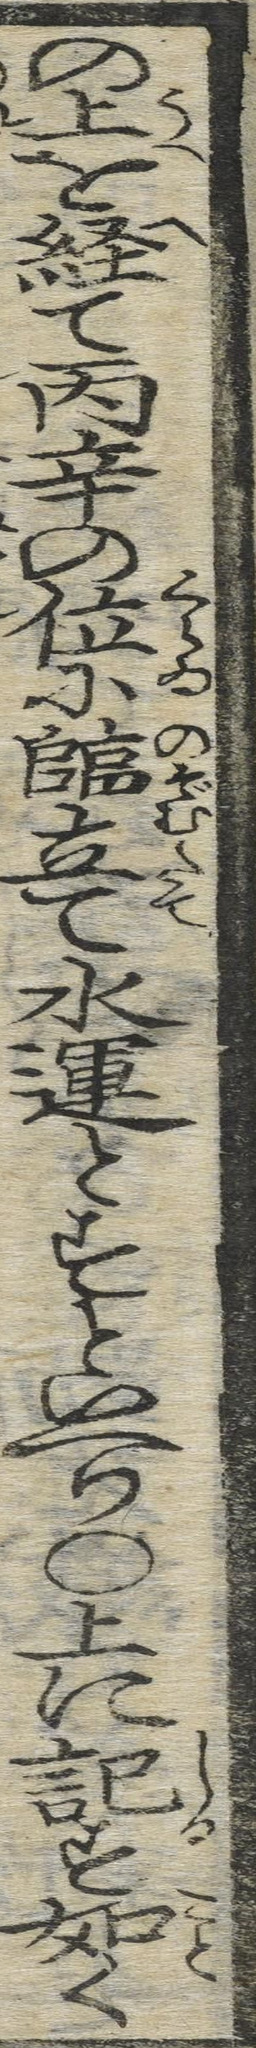の上を経て丙辛の位に臨立て水運とすといへり〇上に記す如く
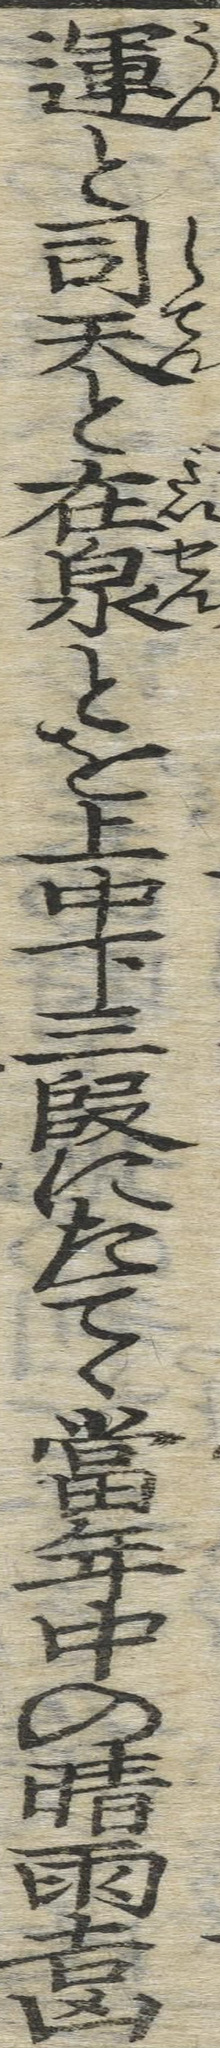運と司天と在泉とを上中下三段にたてゝ當年中の晴雨吉凶
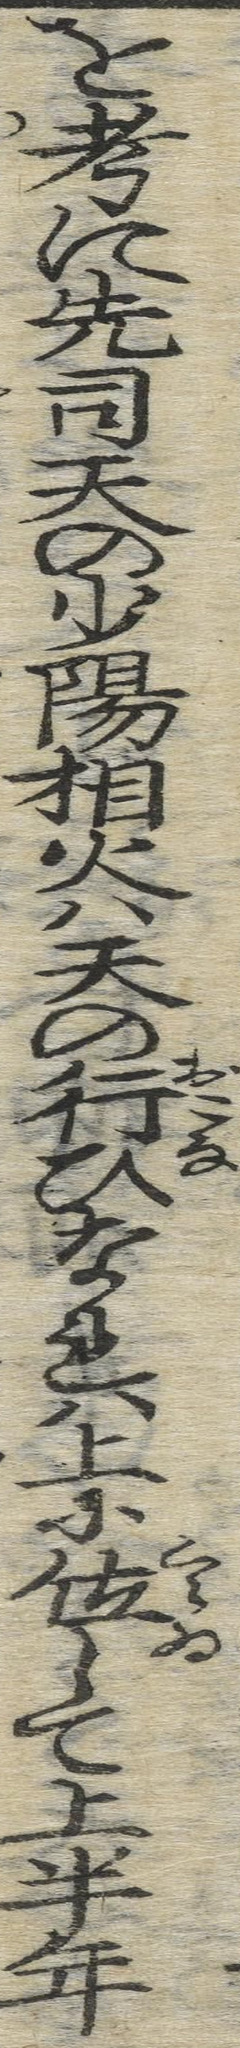を考に先司天の少陽相火は天の行ひなれは上に位して上半年
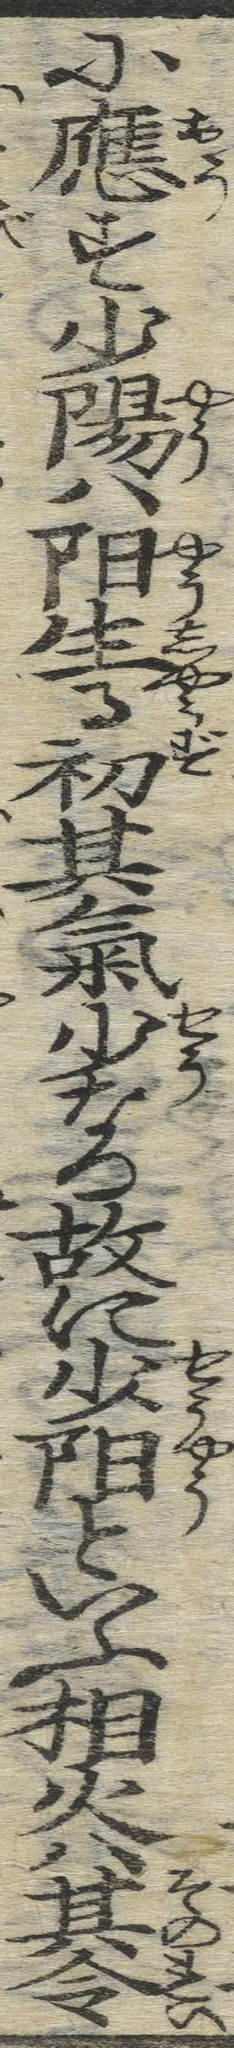に應す少陽は阳生る初其気少なる故に少阳といふ相火は其令
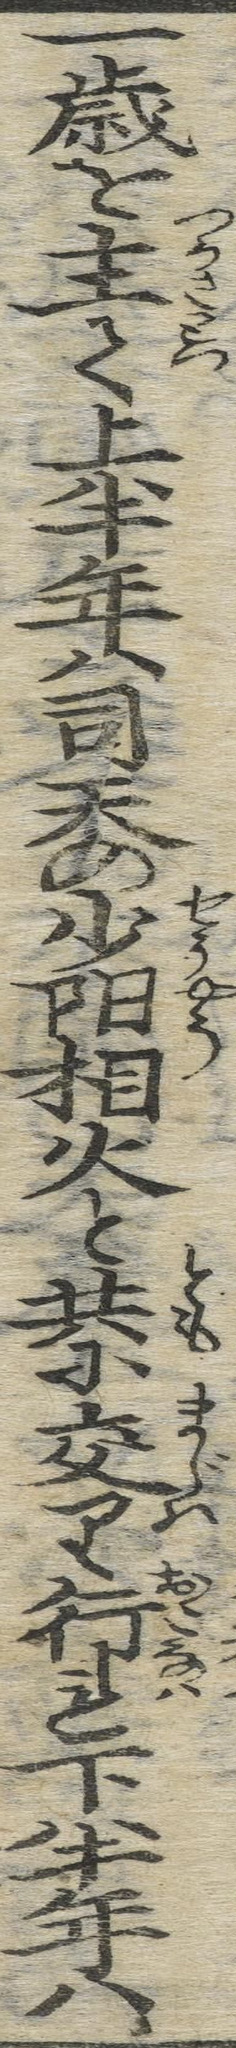一歳を主るゝ上半年は司天の少阳相火と共に交り行れ下半年は
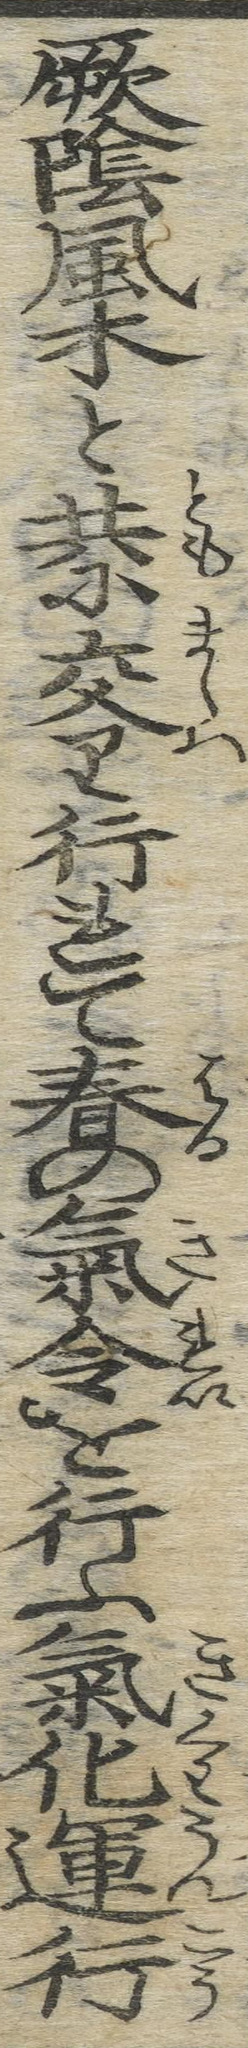厥陰風木と共に交り行れて春の気令を行ふ気化運行
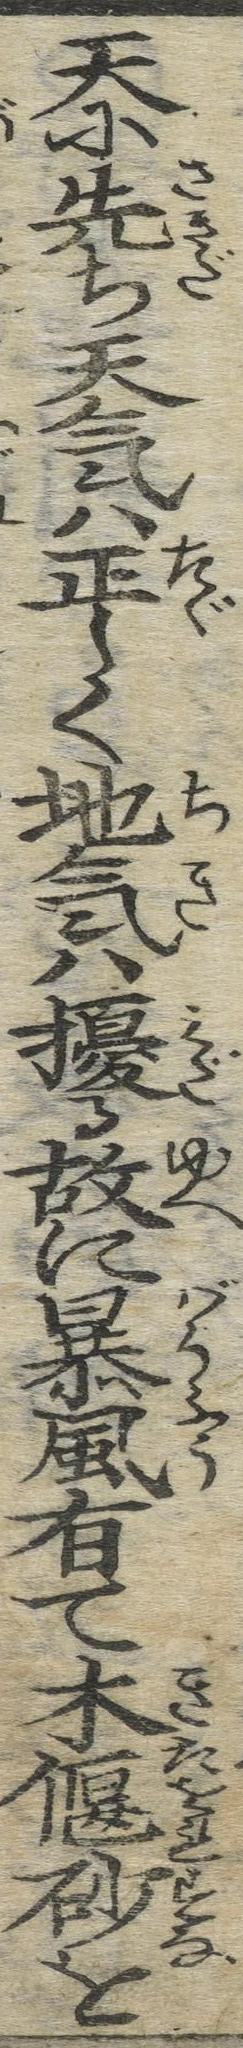天に先ち天気は正しく地気は擾る故に暴風有て木偃砂を
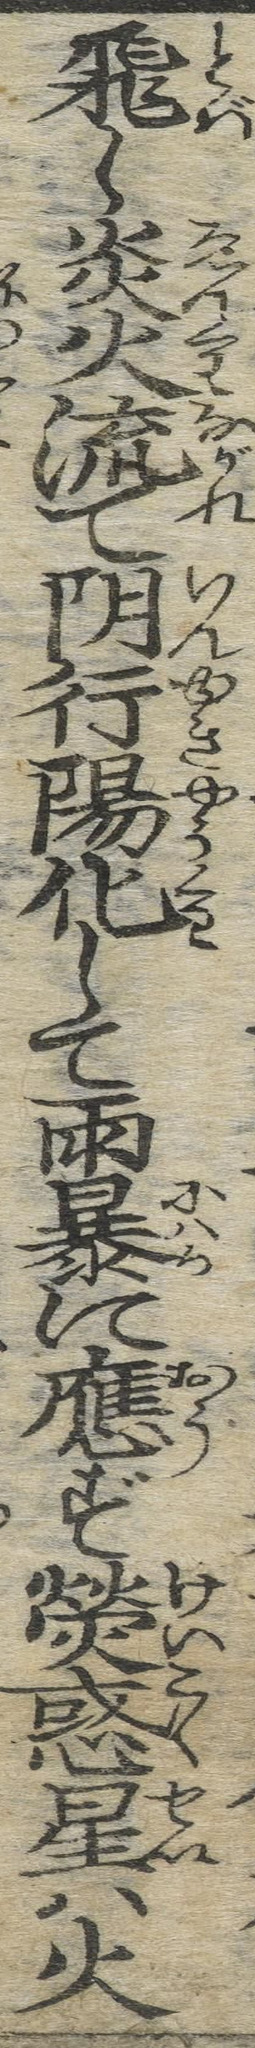飛し炎火流て陰行陽化して雨暴に應ず熒惑星は火
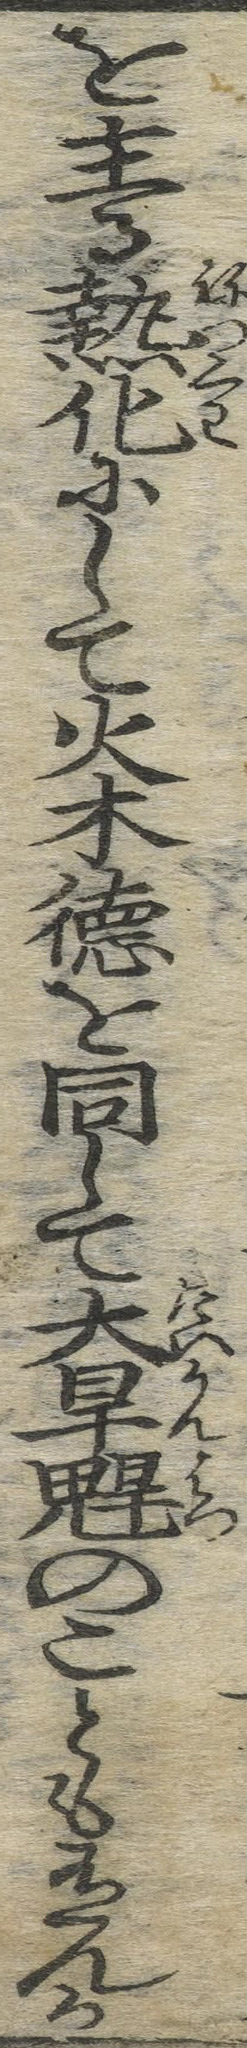を主る熱化にして火木徳を同して大旱魃のことも有んか
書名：[晴雨考]
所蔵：東京大学地震研究所図書室 Earthquake Research Institute Library, The University of Tokyo, JAPAN
